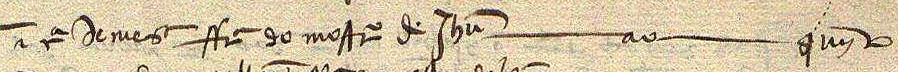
item ca de mesa ffra do mostro de Jhū – ao quȳto
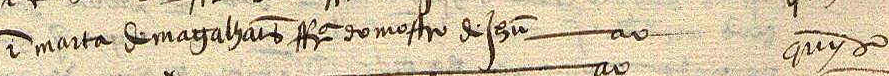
item marta de magalhães ffra do mostro de Jhū ao qūyto
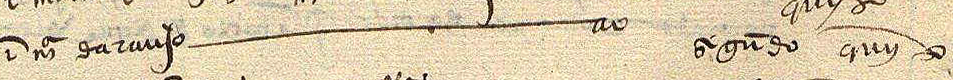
item ma darauJo – ao segūdo q̄uyto
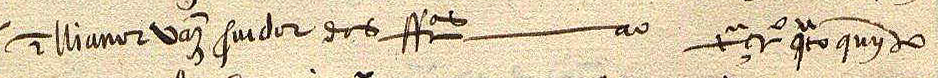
item llianor vaz̄ ꞩuidor das ffras ao t̄cro q̄to q̄uyto
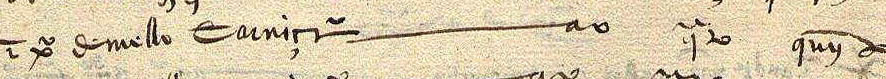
item po de mello Carnicro – ao q̄to qūyto
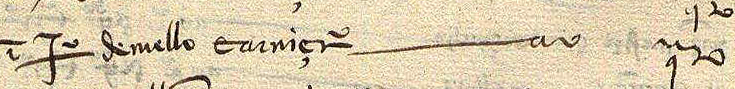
item Jo de mello carnicro – ao q̄to
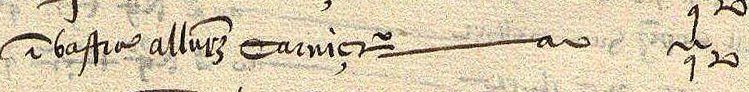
item bastiā alluēz Carnicro ao q̄to
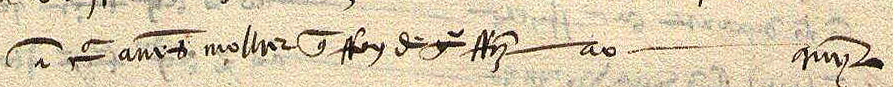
item ca an̄es molher q̄ ffoy de go ffrz̄ – ao qūyto
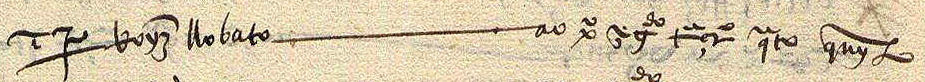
item Jo Royz̄ llobato – ao po segdo t̄cro q̄to qūyto
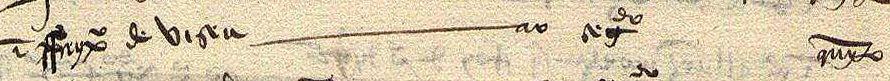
item ffrey po de viseu – ao segdo q̄uyto
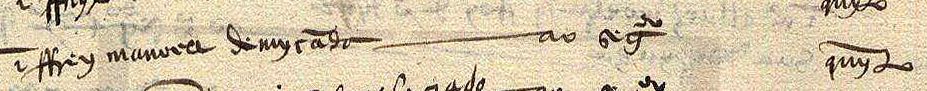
item ffrey manoell de myrāda – ao segdo qūyto
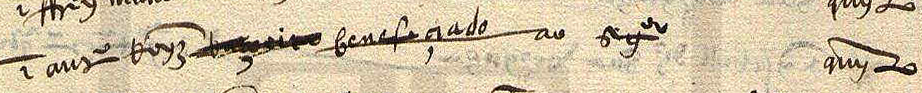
item anto Rōyz Raçoeiro beneficiado – ao segdo qūyto
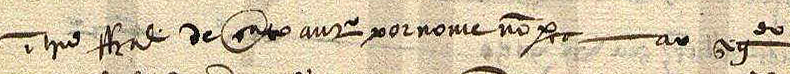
item hū ffrade de s̄ato anto por nome nō ꝑca – ao segdo
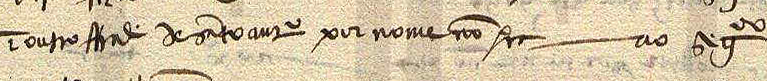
item outro ffrade de sāto anto por nome nō ꝑca – ao segdo
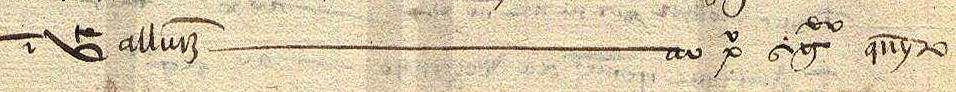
item Vte alluīz – ao po segdo qūyto
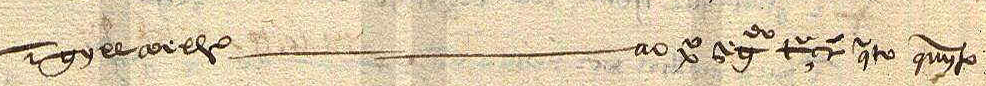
item gyll coelho – ao po segdo t̄cro q̄to qūyto
